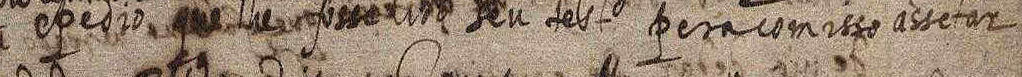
e pedio que lhe fosse lido seu testo pera com isso assētar
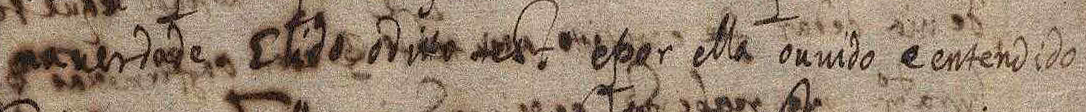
na uerdade E lido o ditto testo e por ella ouuido e entendido
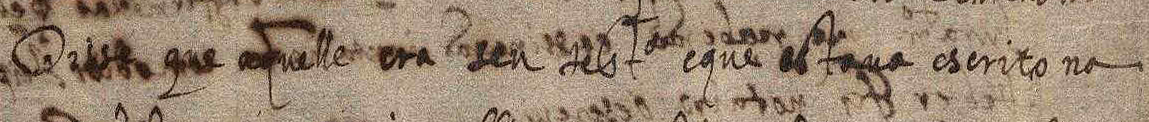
Disse que aquelle era seu testo e que estaua escrito na
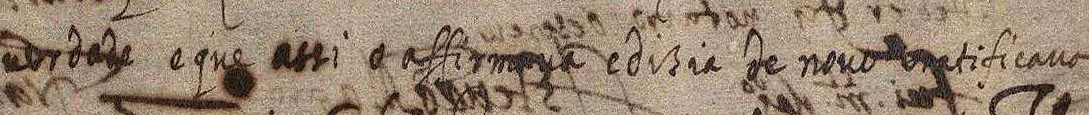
uerdade e que assi o affirmaua e dizia de nouo e ratificaua
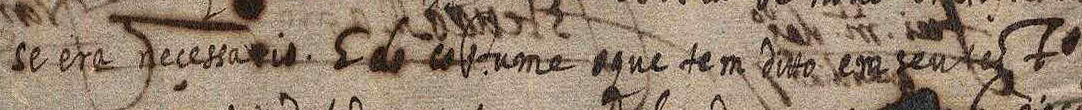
se era necessario. E do costume o que tem ditto em seu testo
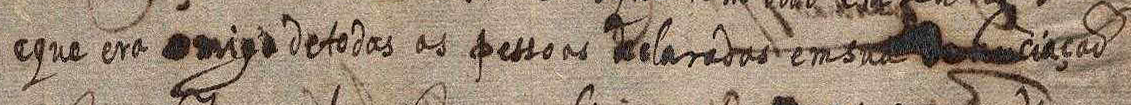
e que era amigo de todas as pessoas declaradas em sua de_ciaçaõ
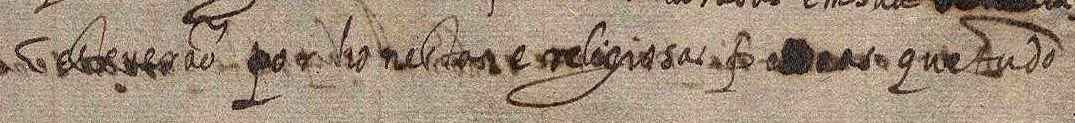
E esteueraõ por honestas e religiosa pe_oas que tudo
